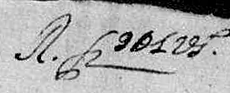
R. fL 901 vs.o
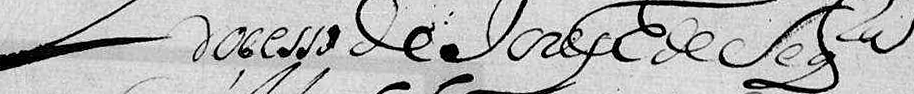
Processo de Jozeph de Seqra
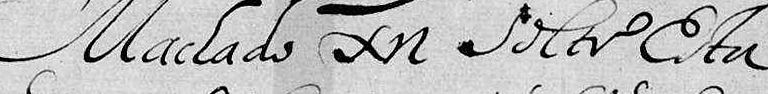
Machado xn soltro Estu
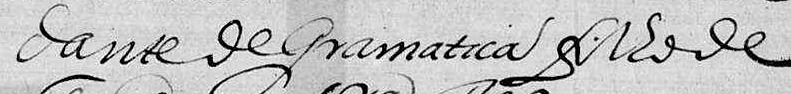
dante de Gramatica filho de
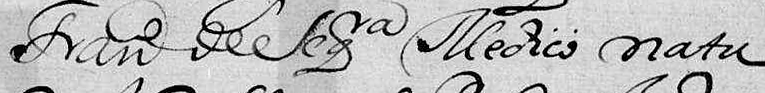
Franco de Seqra Medico natu
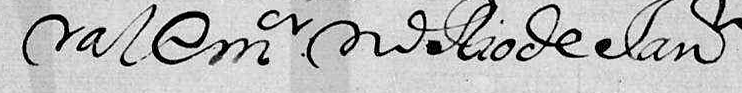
ral e mor. no Rio de Ianro
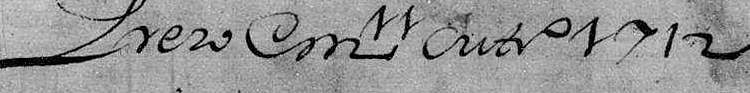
Prezo em 11 outro 1712
